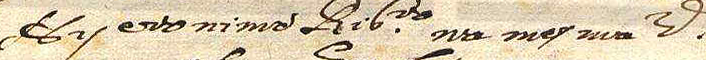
Hyeronimo Rib.ro na mesma V.a
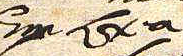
Em Lx.a
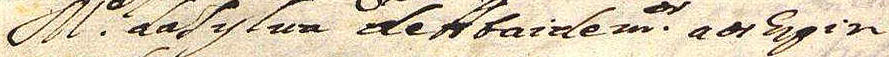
M.el da Sylua de Ataide mor. aos Espin
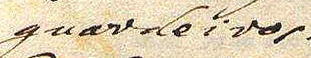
guardeiros.
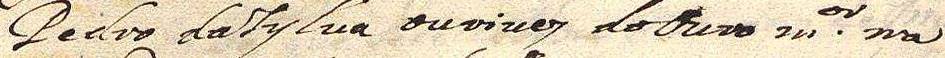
Pedro da Sylua ouriues do Ouro mor. na
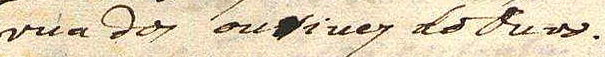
rua dos ouriues do Ouro.
